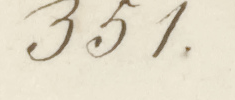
351.
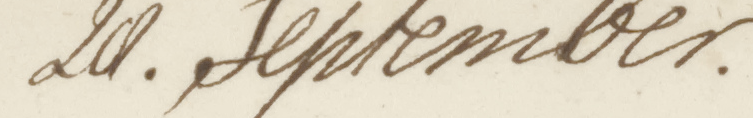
28. September.
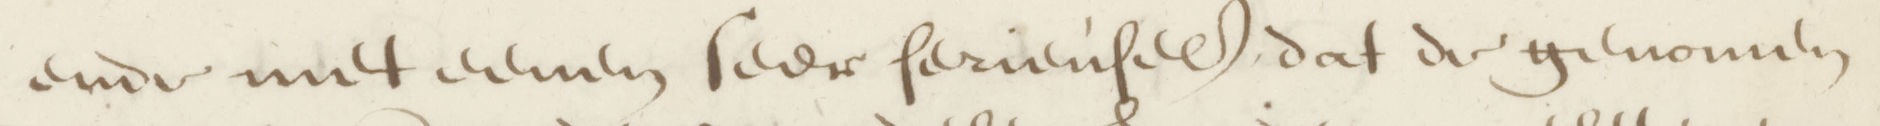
ende met eenen seer serieusel, dat de genomen
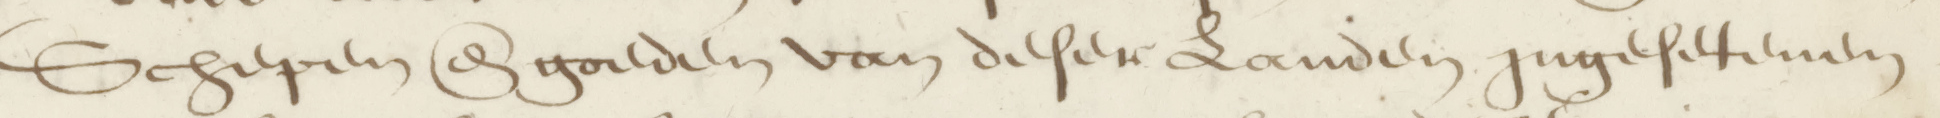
Schepen & goeden van deser Landen Ingesetenen
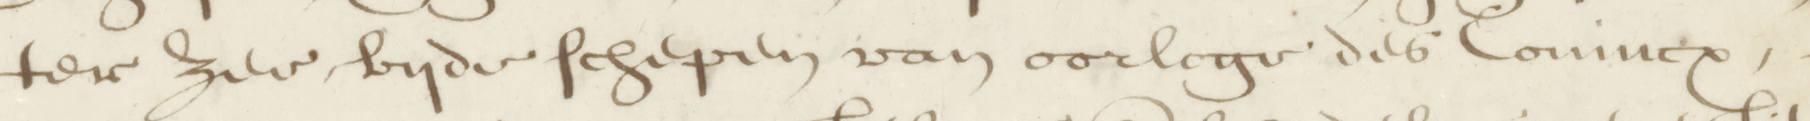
ter zee, byde schepen van oorloge des Conincx,
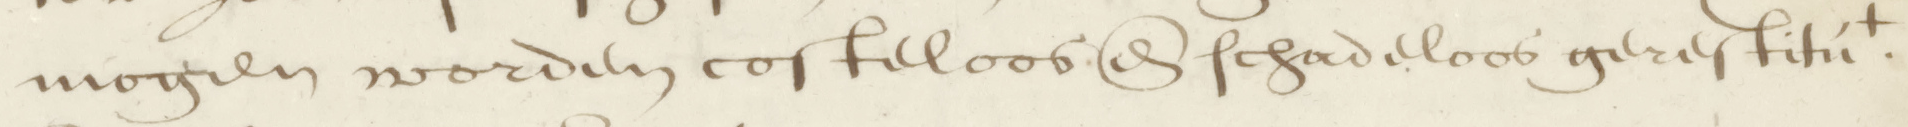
mogen worden costeloos & schadeloos gerestitut.
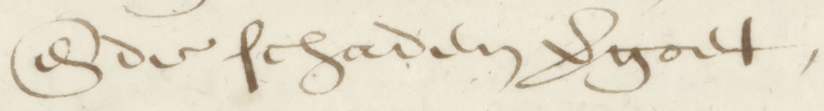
& de schaden vgoet.
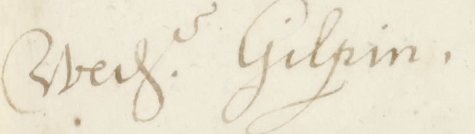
Wede. Gilpin
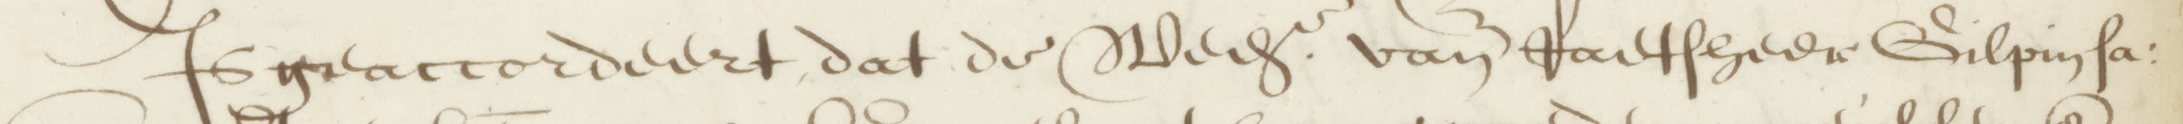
Is geaccordeert dat de Wede. van Raetsheer Gilpin sa:
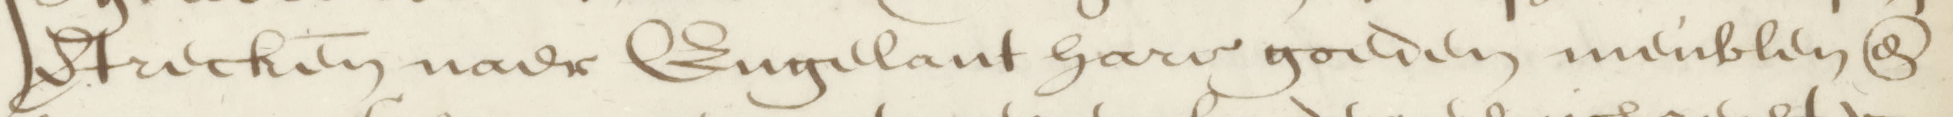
vtrecken naer Engelant hare goeden meublen &
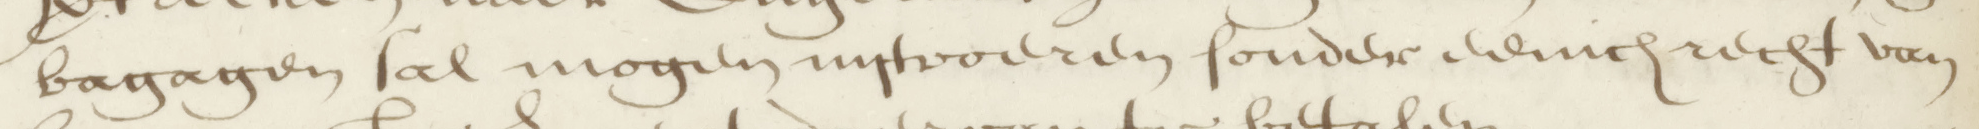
bagagen sal mogen uytvoeren sonder eenich recht van
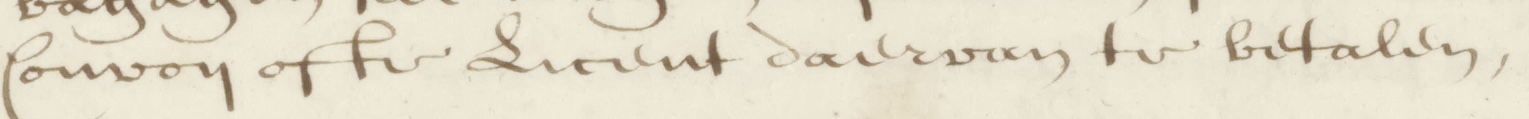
Convoy ofte Licent daervan te betalen.
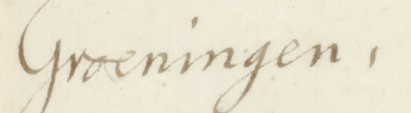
Groeningen.
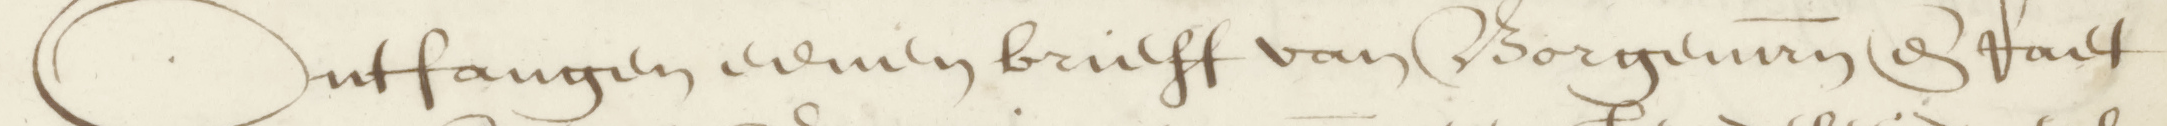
Ontfangen eenen brieff van Borgemrn & Raet
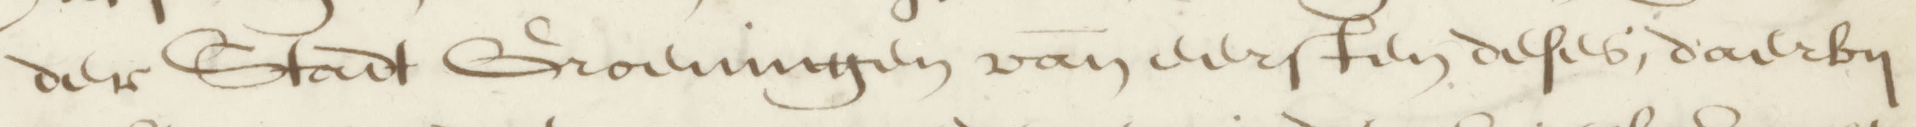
der Stadt Groeningen van eersten deses, daerby
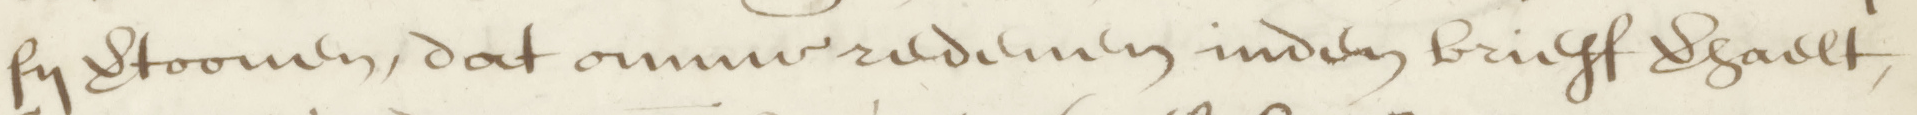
sy vtoonen, dat omme redenen inden brieff vhaelt,
